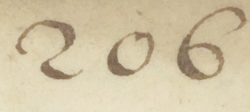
206
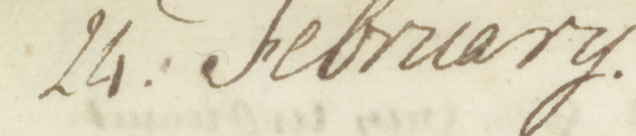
24. February.
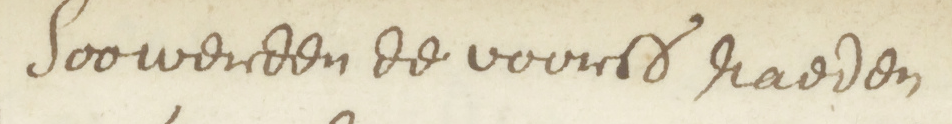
Soo werden de voors raeden
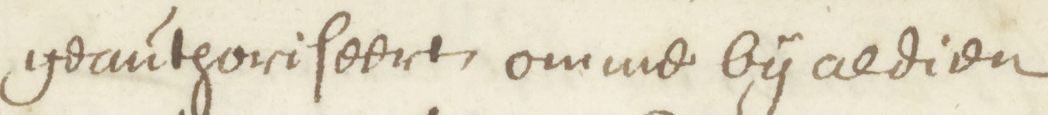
geauthoriseert, omme bij aldien
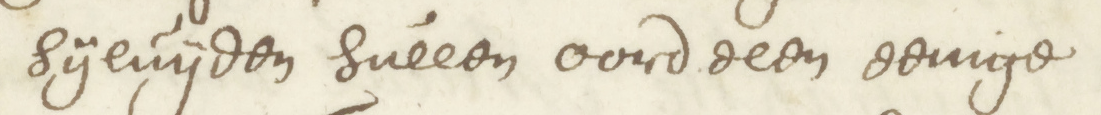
sijluijden sullen oordelen eenige
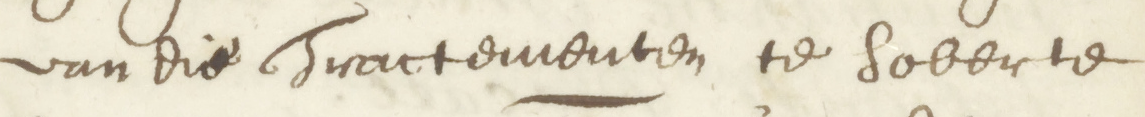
van die Tractementen te sober te
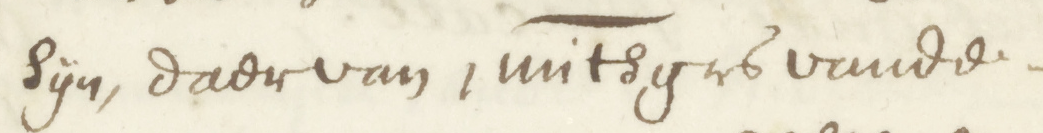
sijn, daervan, mitsgrs vande
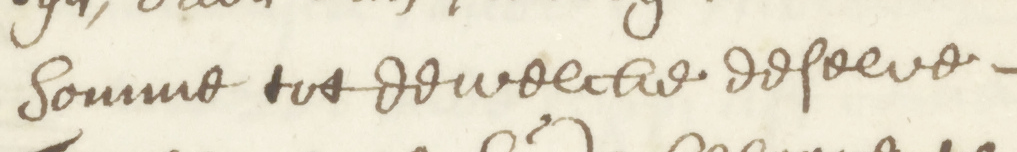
somme tot dewelcke deselve
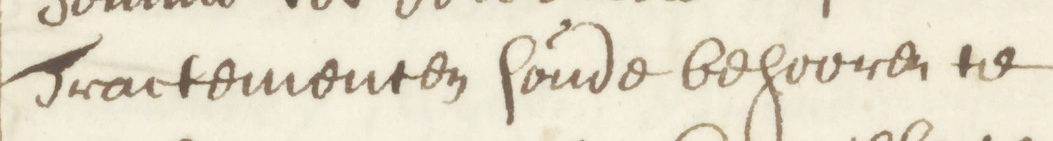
Tractementen soude behooren te
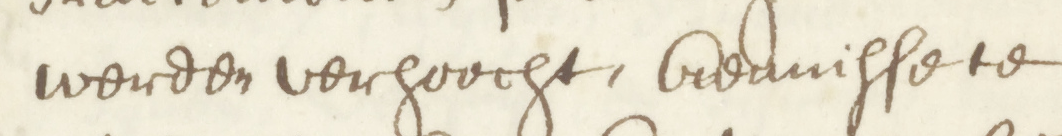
werden verhoocht, kennisse te
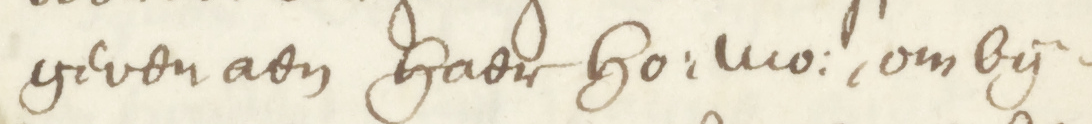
geven aen haer Ho:Mo:, om bij
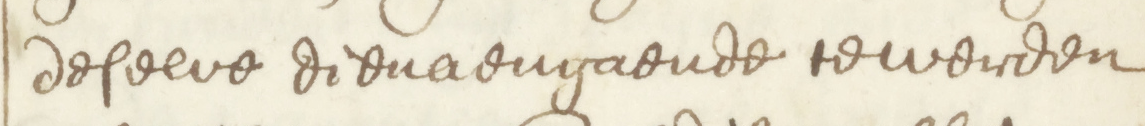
deselve dienaengaende te werden
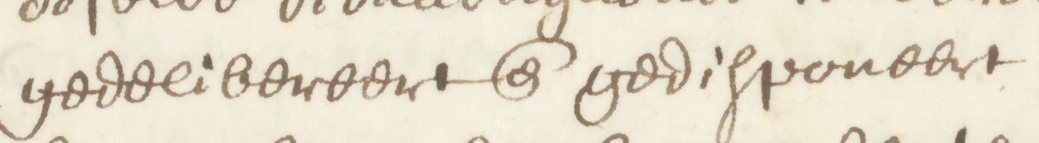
gedelibereert & gedisponeert
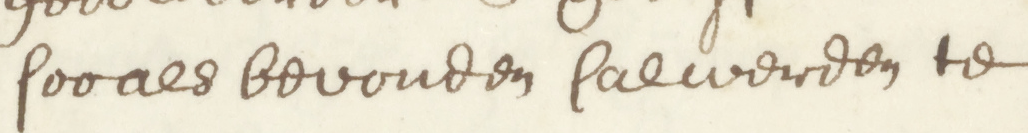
sooals bevonden sal werden te
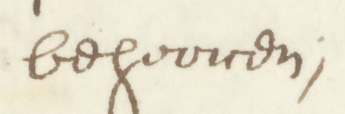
behooren.
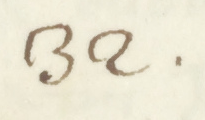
32.
